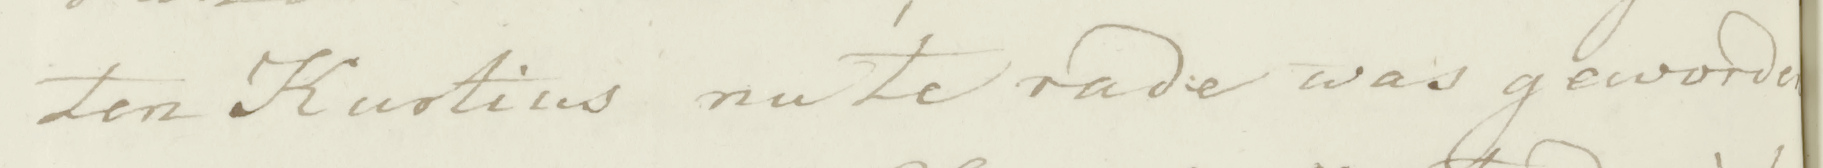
ten Kurtius, nu te rade was geworden
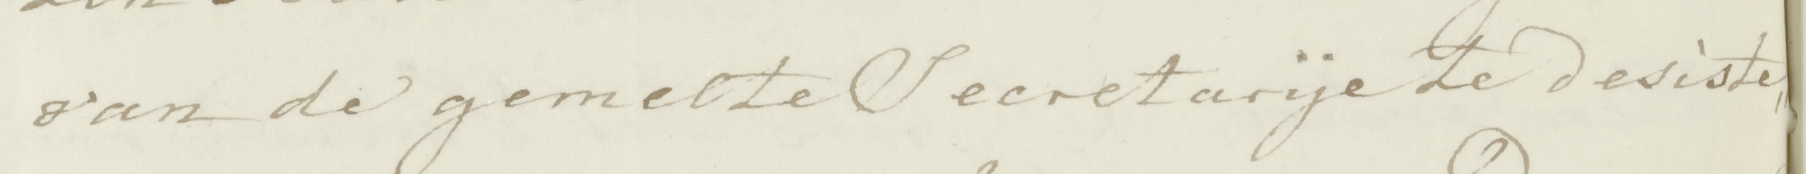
van de gemelte Secretarije te desiste„
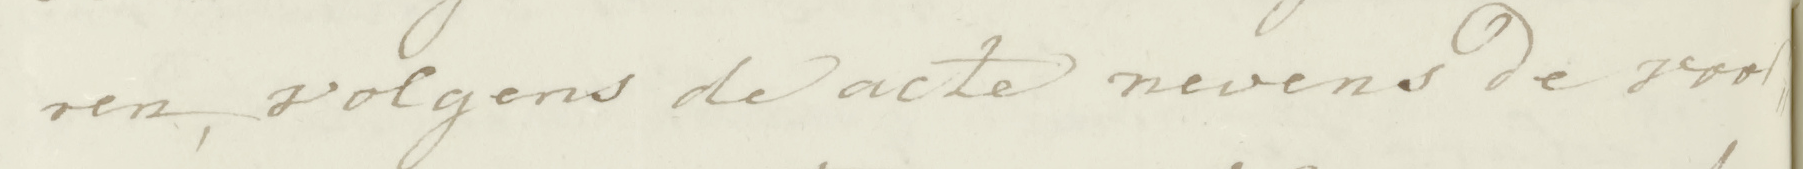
ren volgens de acte nevens de voor„
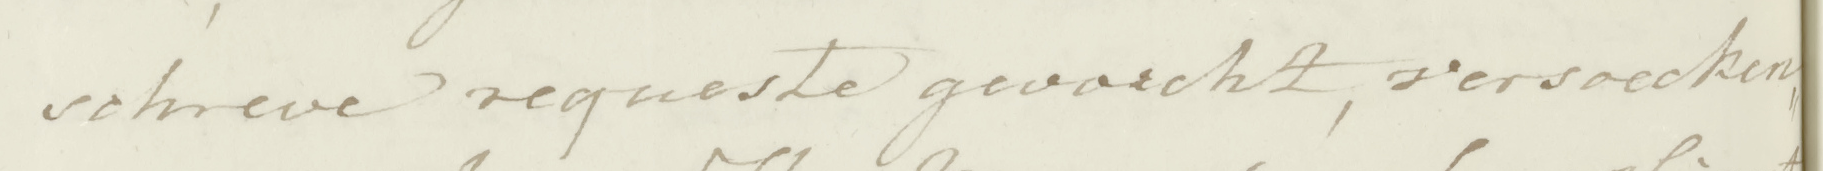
schreve requeste gevoecht versoecken„
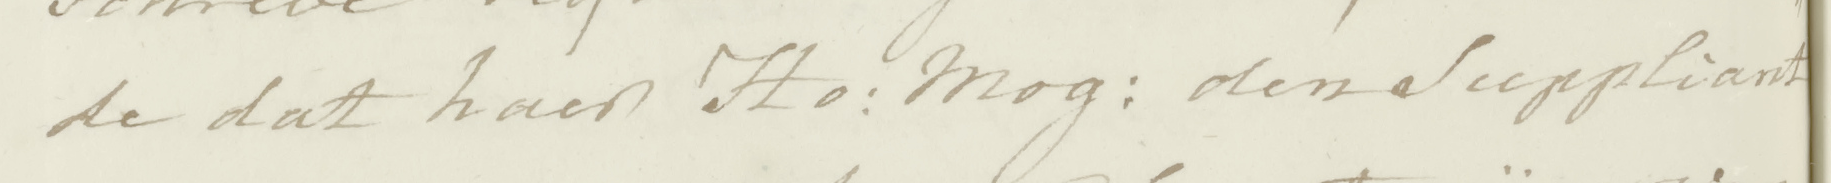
de dat haer Ho: Mog: den Suppliant
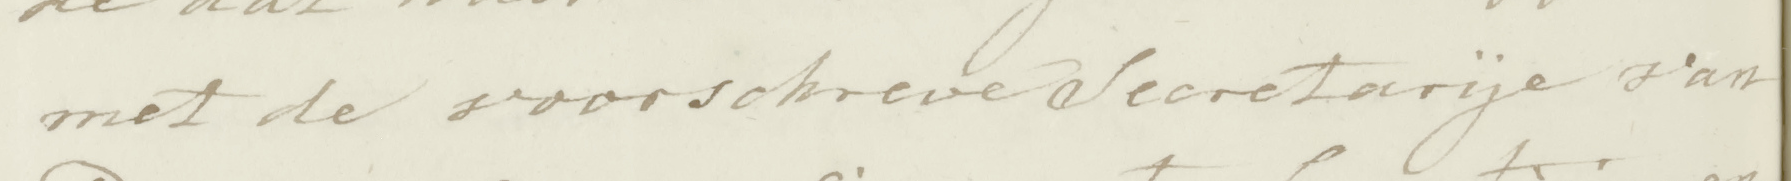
met de voorschreve Secretarije van
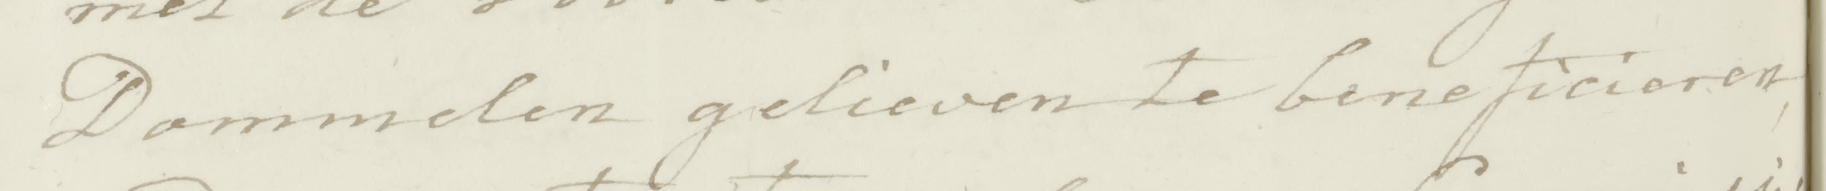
Dommelen gelieven te beneficieren
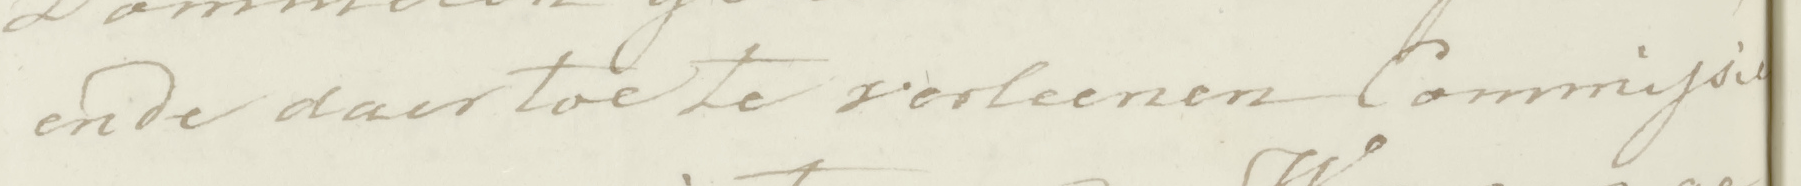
ende daertoe te verleenen Commissie
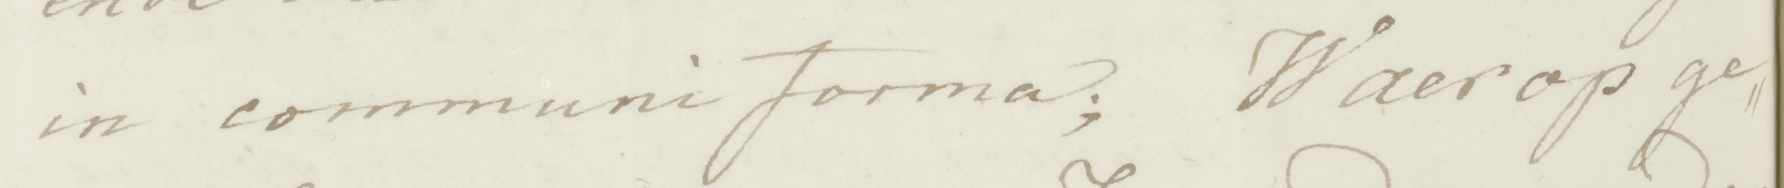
in communi forma; Waer op ge„
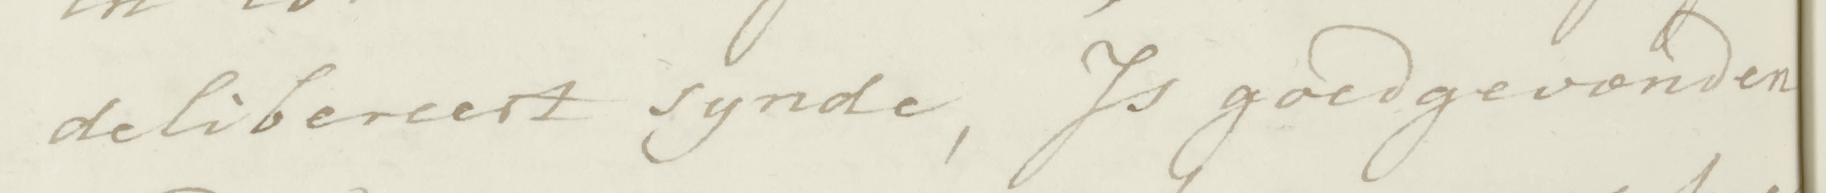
delibereert sijnde, Is goedgevonden
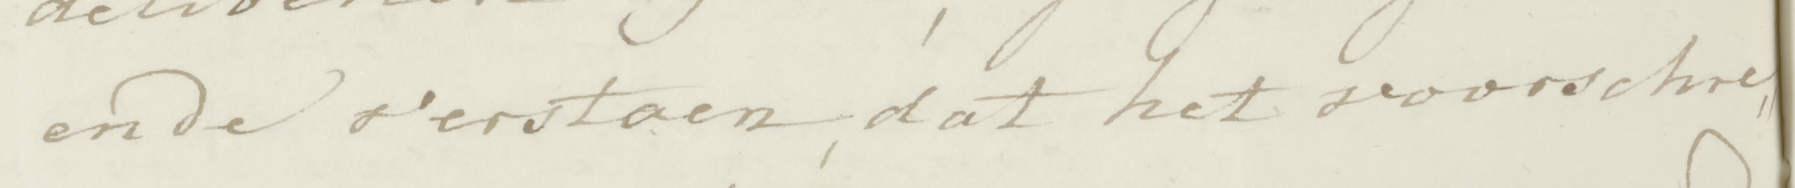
ende verstaen dat het voorschre„
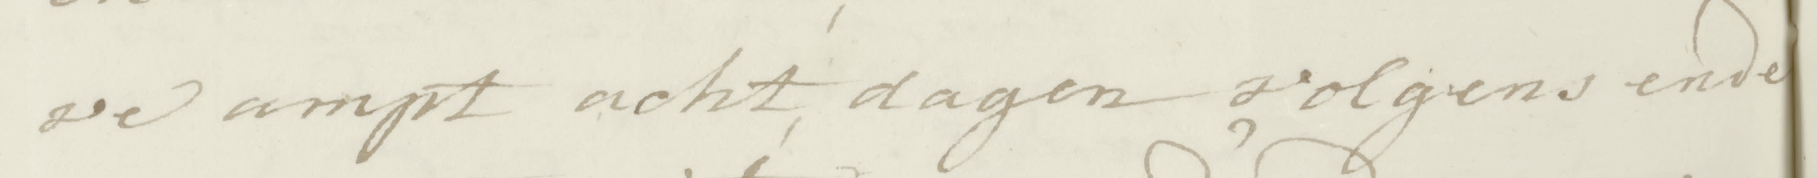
ve ampt acht dagen volgens ende
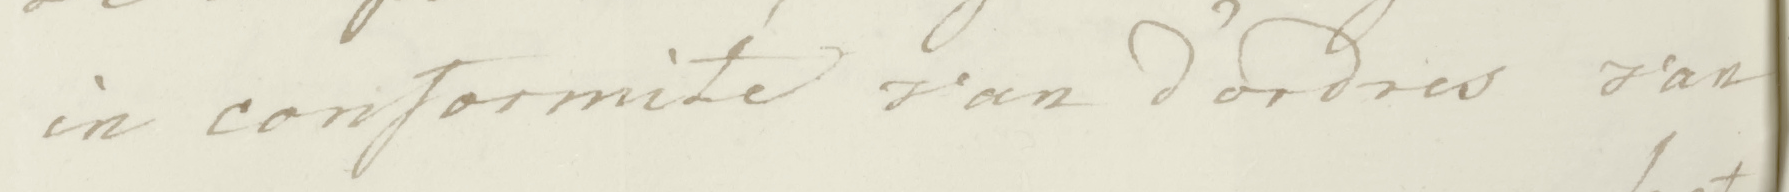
en conformité van d'ordres van
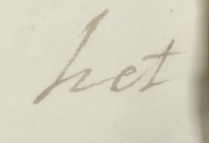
het
